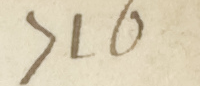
716
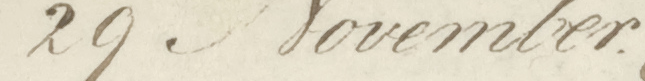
29. November.
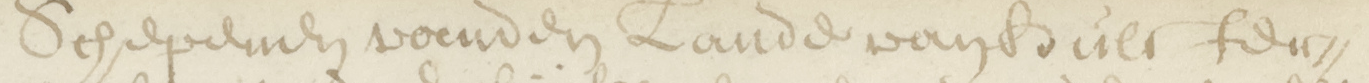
Schepenen vanden Lande van Hulster„
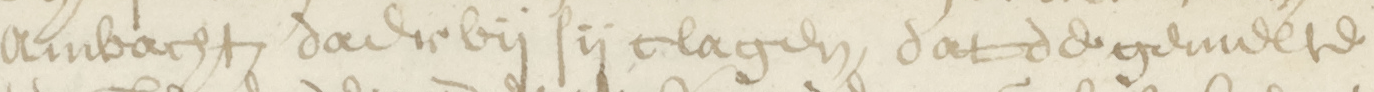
ambacht, daerbij sij clagen, dat de gemelte
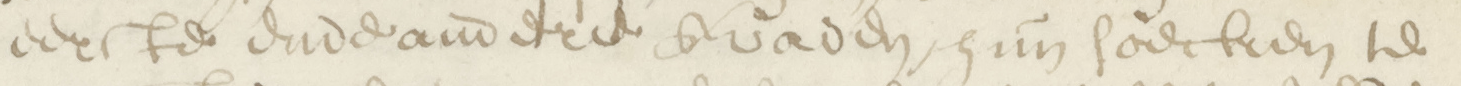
eerste ende andere Raden, hun soecken te
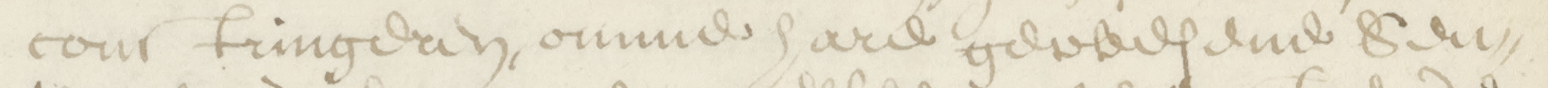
constringeren, omme hare gewesene Sen„
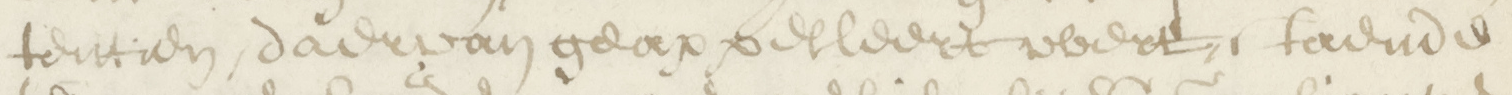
tentien, daervan geappelleert wert, staende
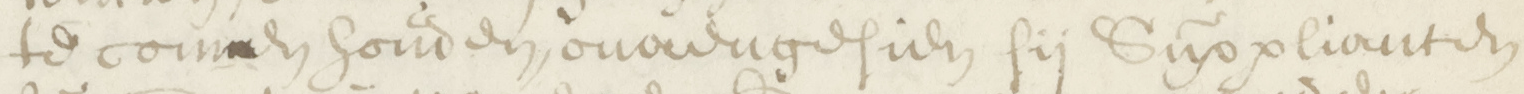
te connen houden, onaengesien sij Supplianten
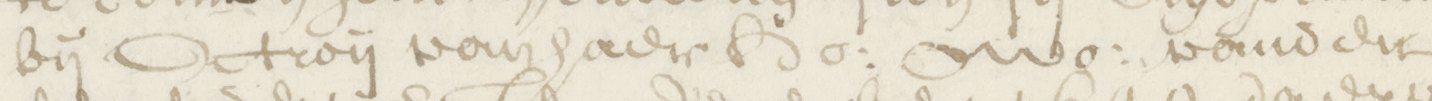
bij Octroij van haer Ho:Mo: vanden
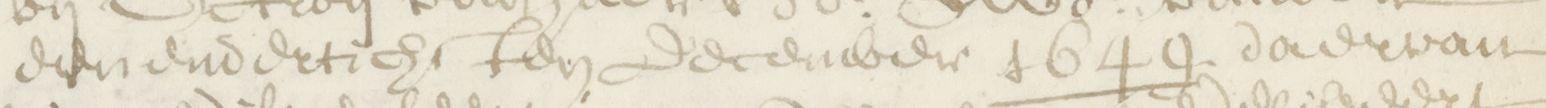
eenendertichsten December 1649 daervan
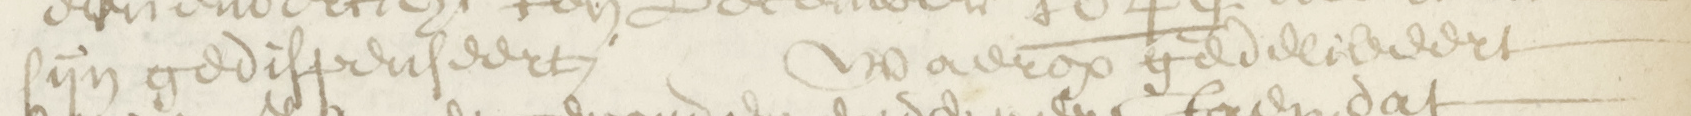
sijn gedispenseert; Waerop gedelibeert
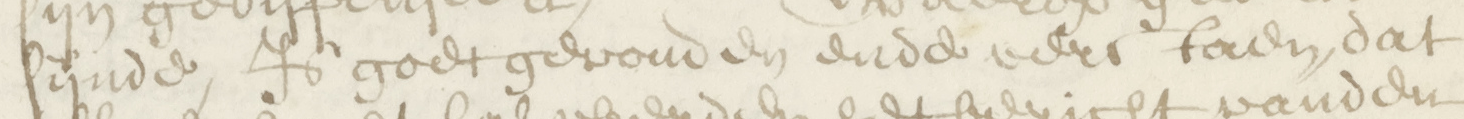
sijnde, Is goetgevonden ende verstaen, dat
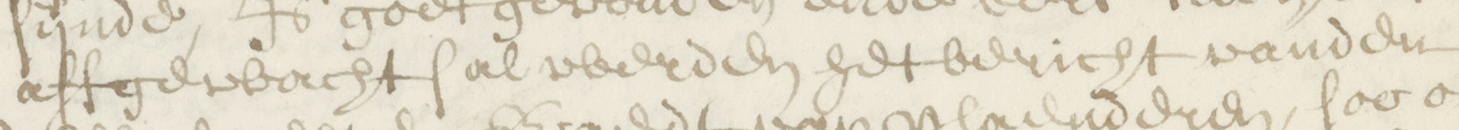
affgewacht sal werden het bericht vanden
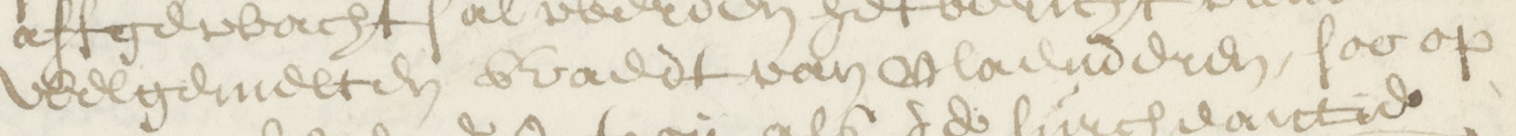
welgemelten Raedt van Vlaenderen, soo op
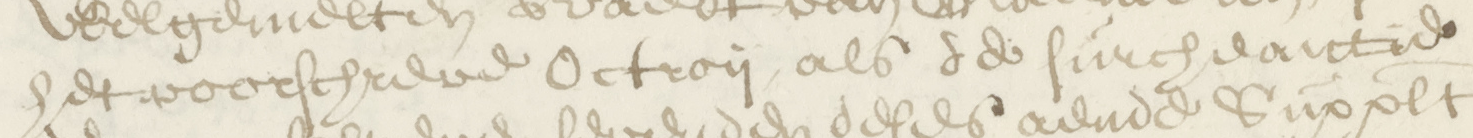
het voorschreve Octroij, als de surcheantie
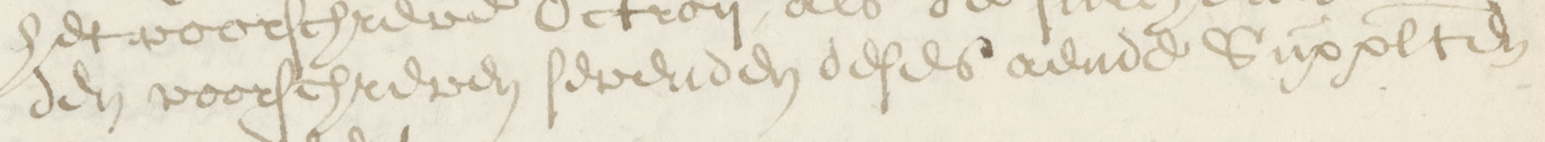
den voorschreven sevenden deses aende Supplten.
